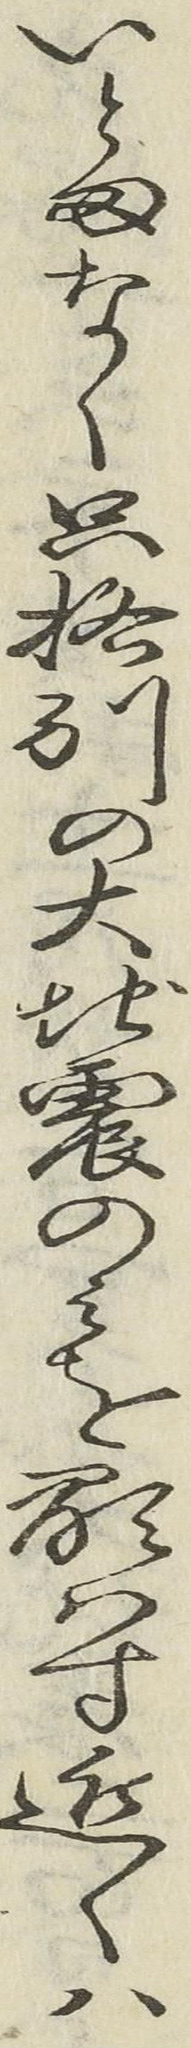いとまなく只格別の大地震のみを顕はす近くは
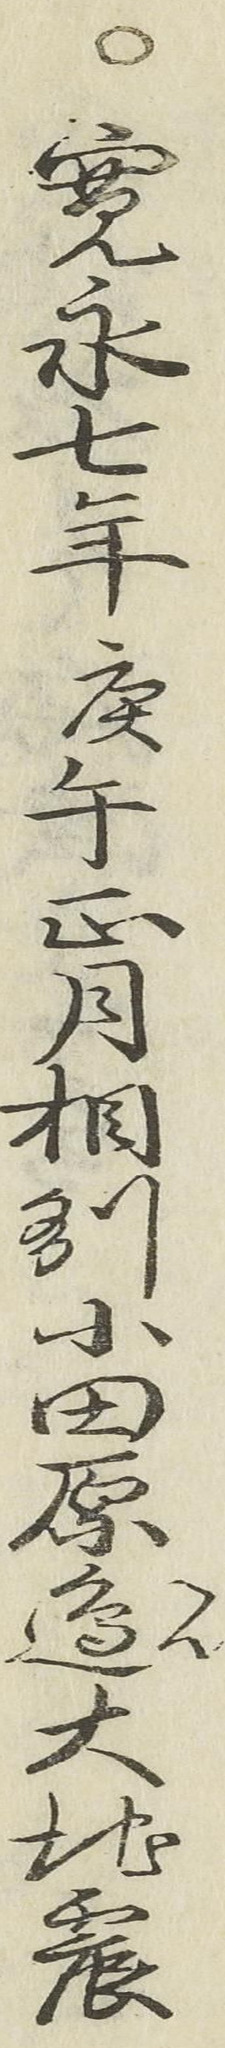〇寛永七年庚午正月相州小田原邊大地震
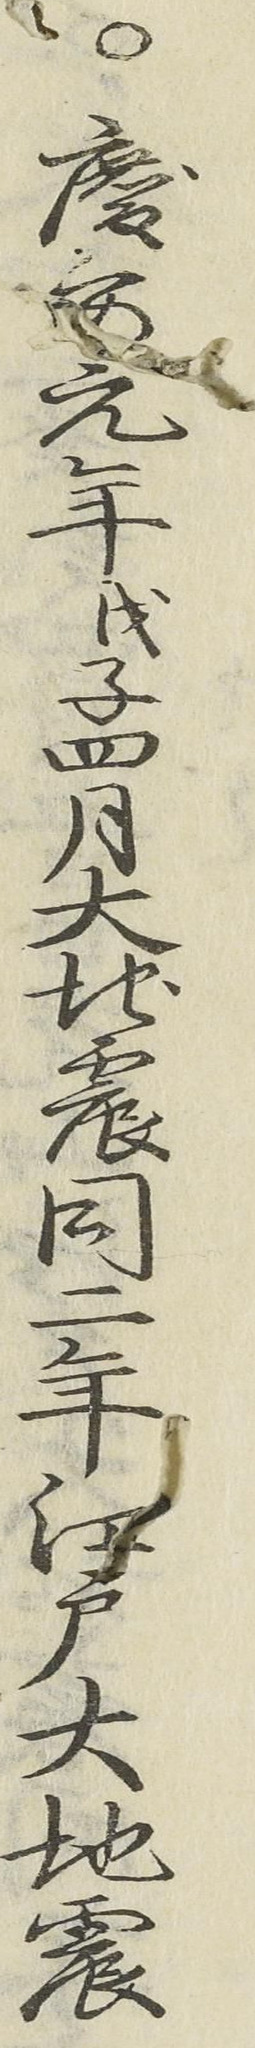〇慶安元年戊子四月大地震同二年江戸大地震
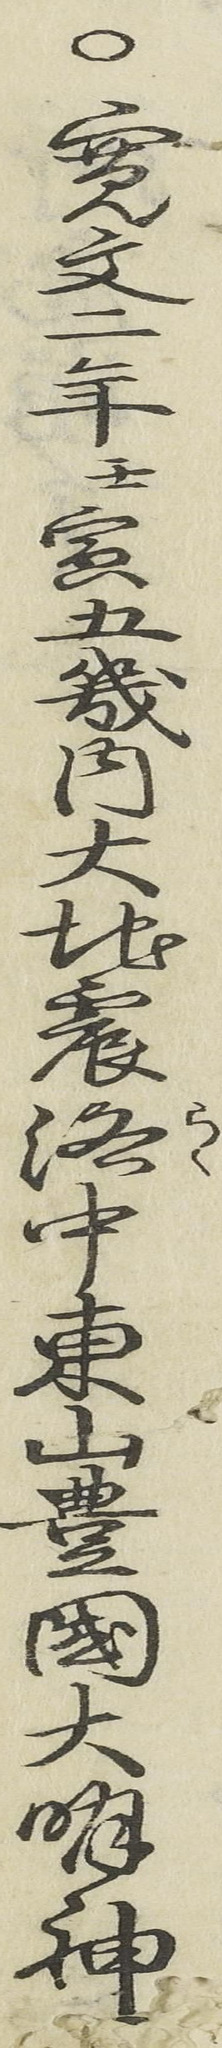〇寛文二年壬寅五畿内大地震洛中東山豊国大明神

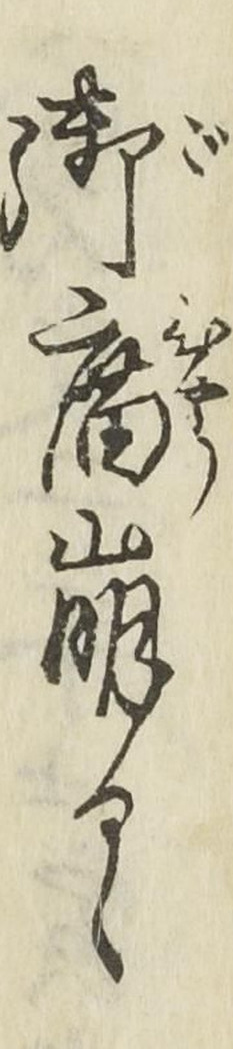御廟崩るゝ
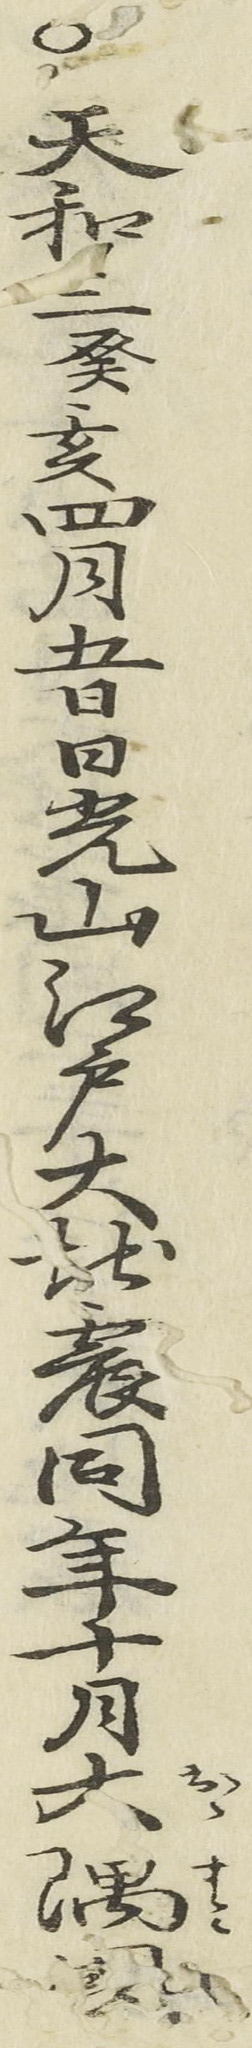〇天和二癸亥四月五日日光山江戸大地震同年十月大隅国
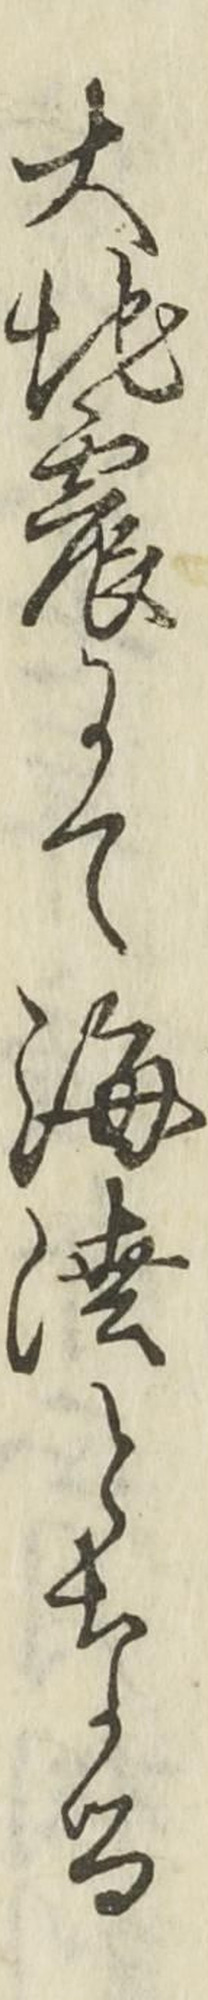大地震にて海陸となる
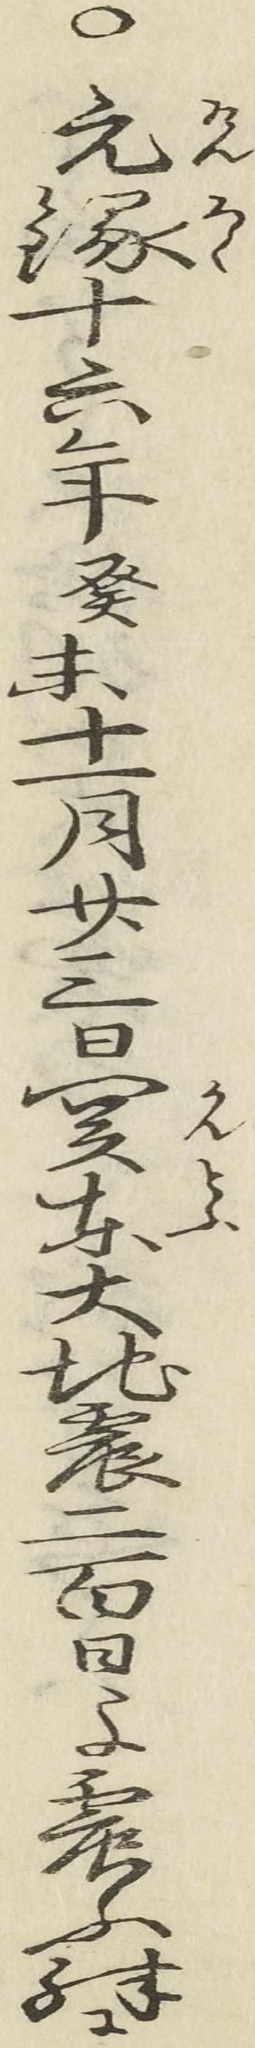〇元禄十年癸未十一月廿三日関東大地震二百日余震ふ殊に
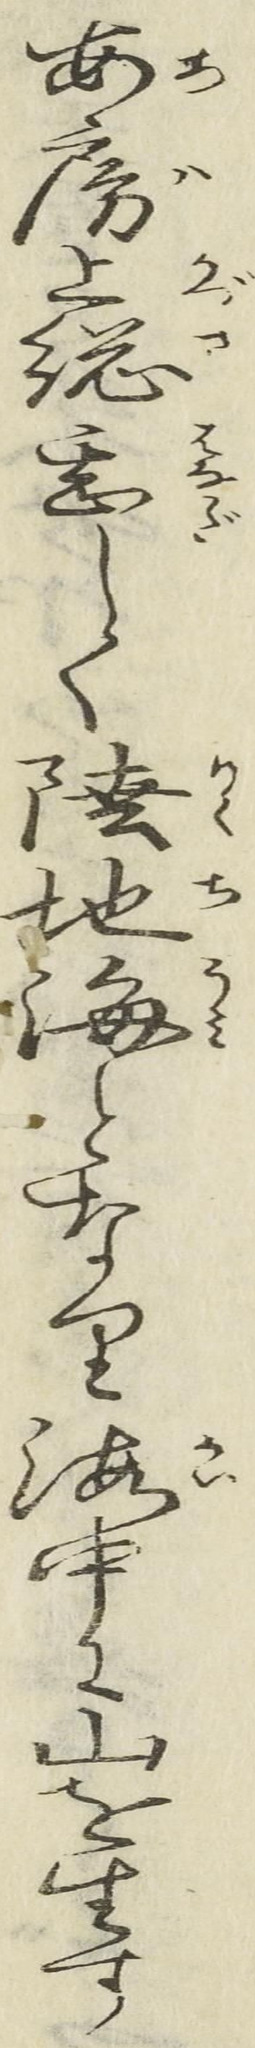安房上総甚しく陸地海となり海中に山を生す
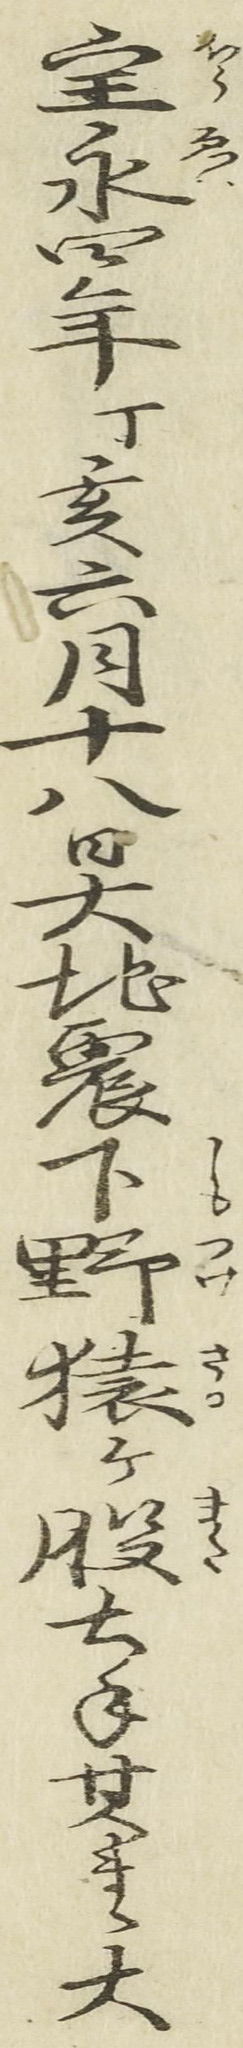〇宝永四年丁亥六月十八日大地震下野猿ケ股土手其まゝ大
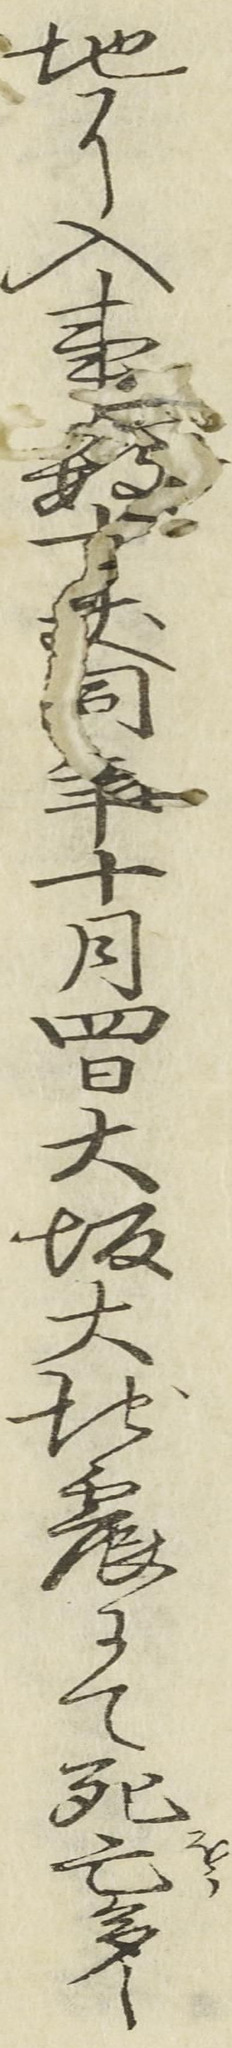地に入事数十丈同年十月四日大坂大地震にて死亡多し
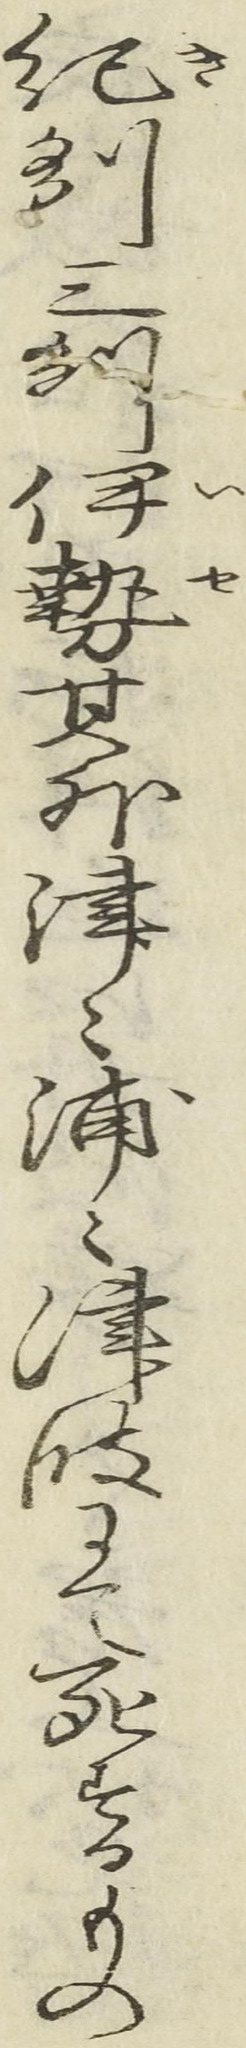紀州三州伊勢其外津々浦々津波にて死するもの
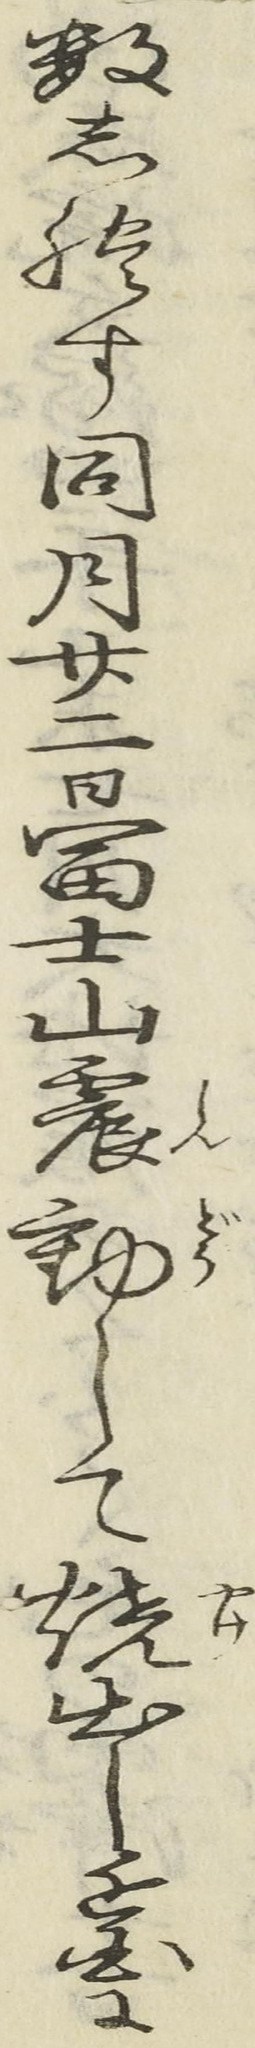数しれす同月廿二日富士山震動して焼出し近国に
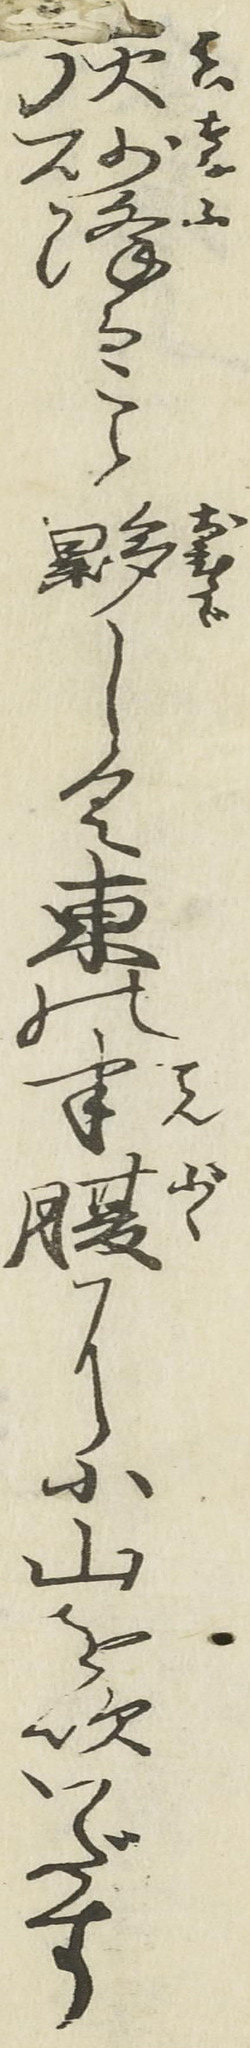灰砂降ること夥しく東の半腹に小山を吹いだす
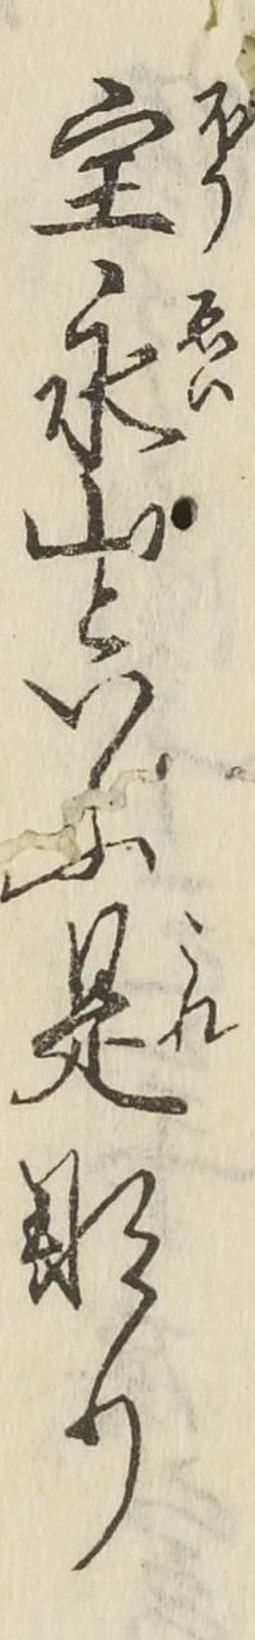宝永山といふ是なり
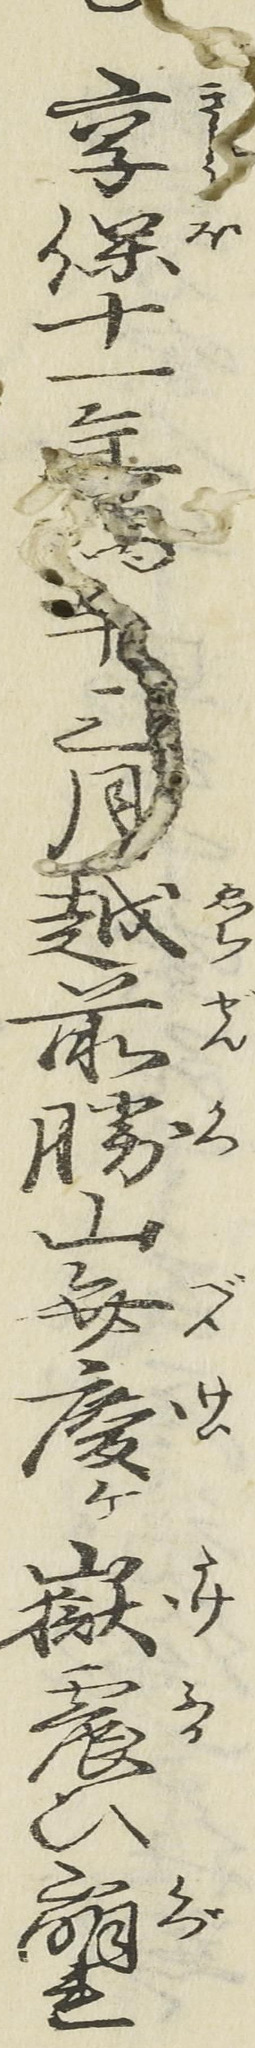〇享保十一年丙午三月越前勝山弁慶ヶ嶽震ひ崩れ
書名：震雷考説　全
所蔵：東京大学地震研究所図書室 Earthquake Research Institute Library, The University of Tokyo, JAPAN
